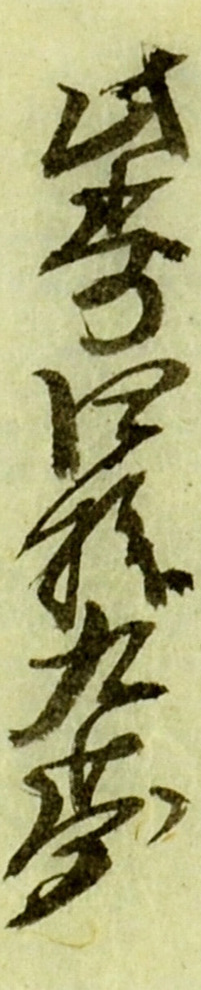此歩四拾九歩
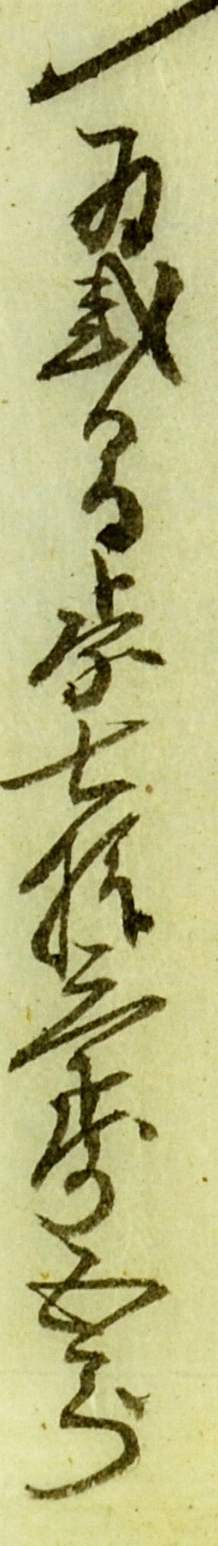為弐間歩七拾三歩五分
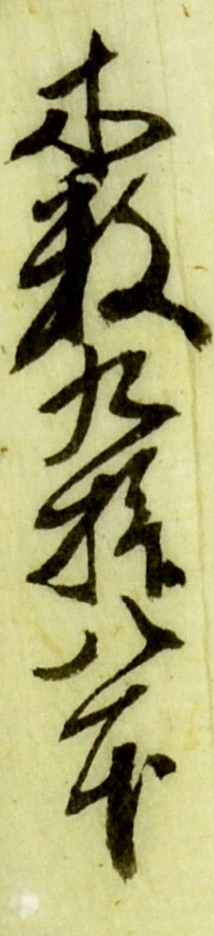木数九拾八本

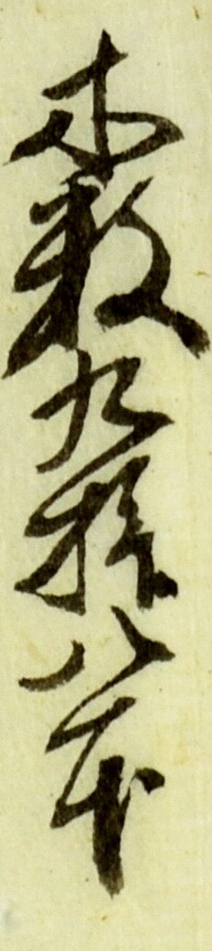木数九拾八本
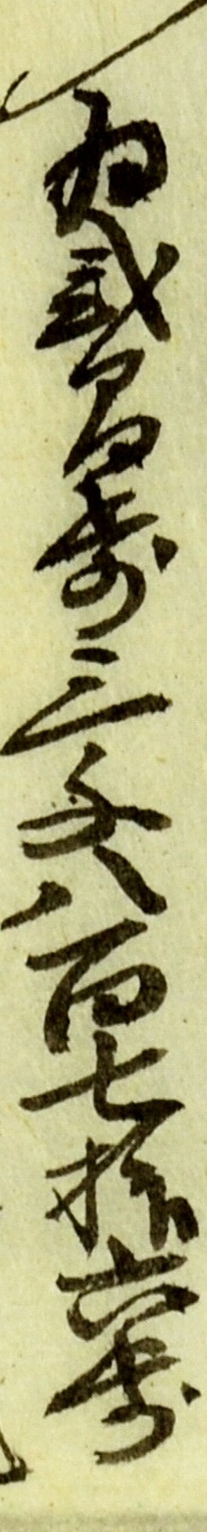為弐間歩三千八百七拾六歩
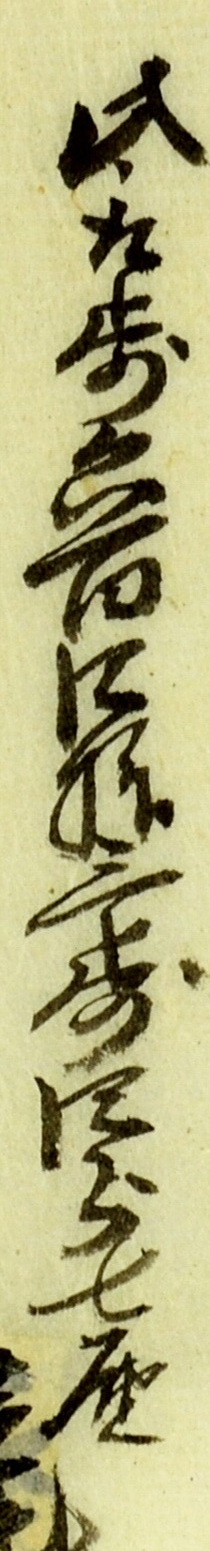此取歩六百四拾三歩四分七厘
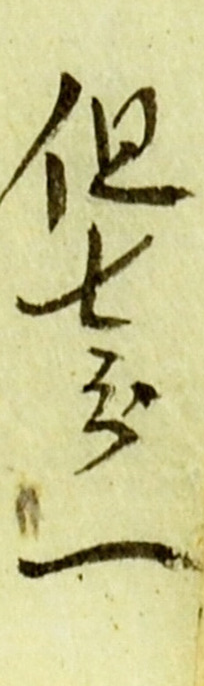但七分一
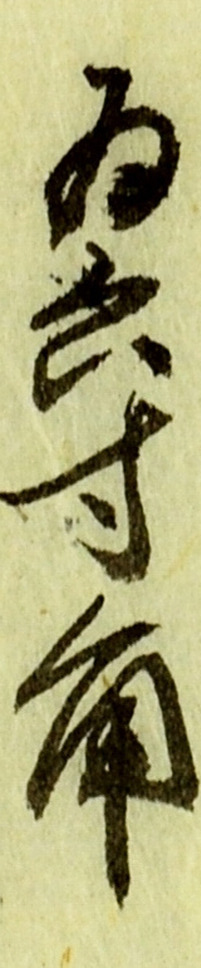為六寸角
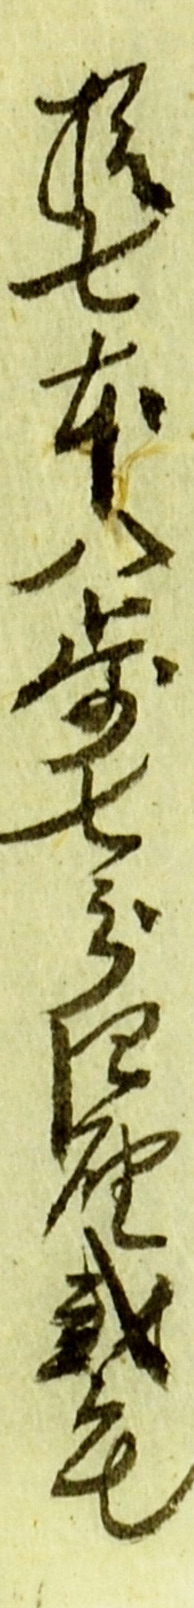拾七本八歩七分四厘弐毛
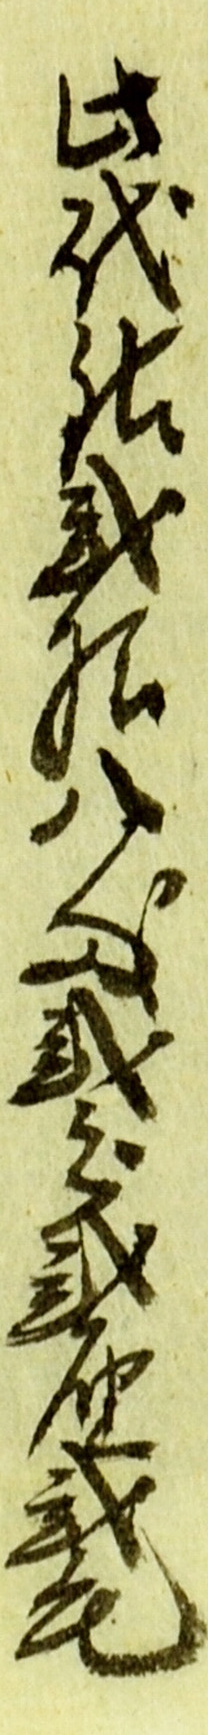此代銀弐拾八匁弐分弐厘弐毛
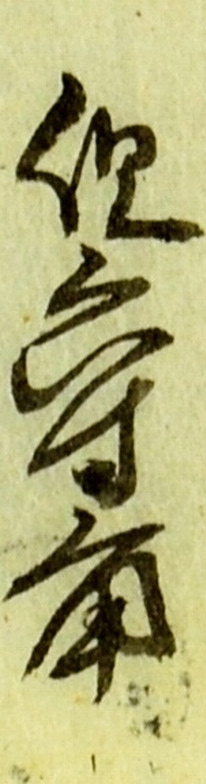但六寸角
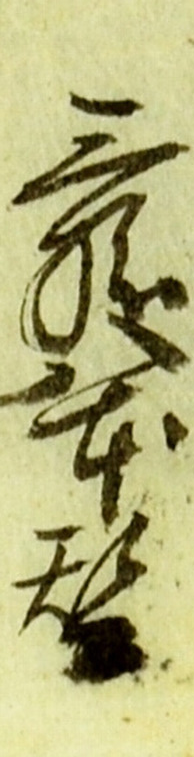三拾八本替
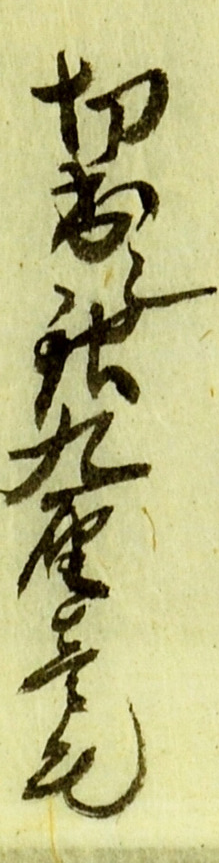切出シ銀九厘壱毛
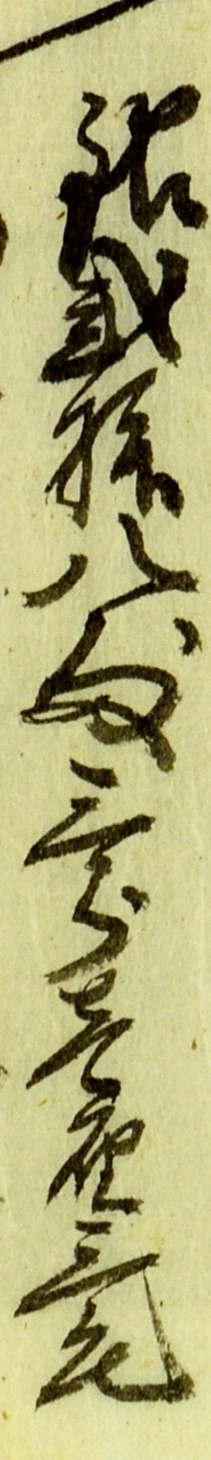銀弐拾八匁三分壱厘三毛
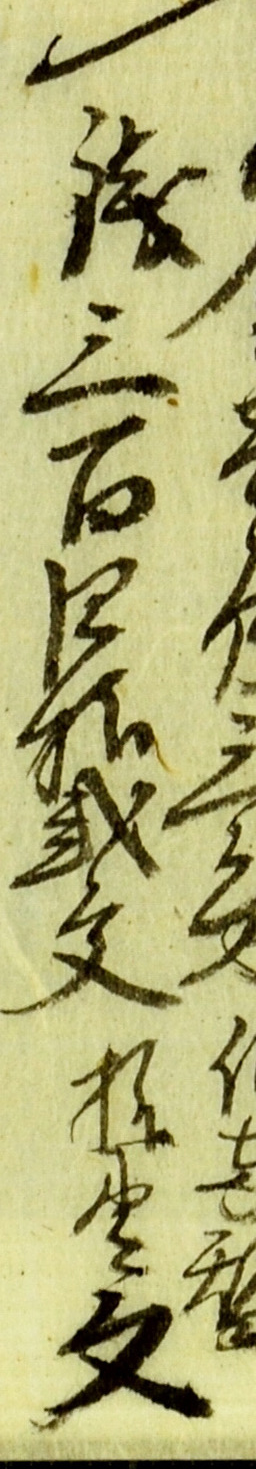銭三百四拾弐文拾貫文

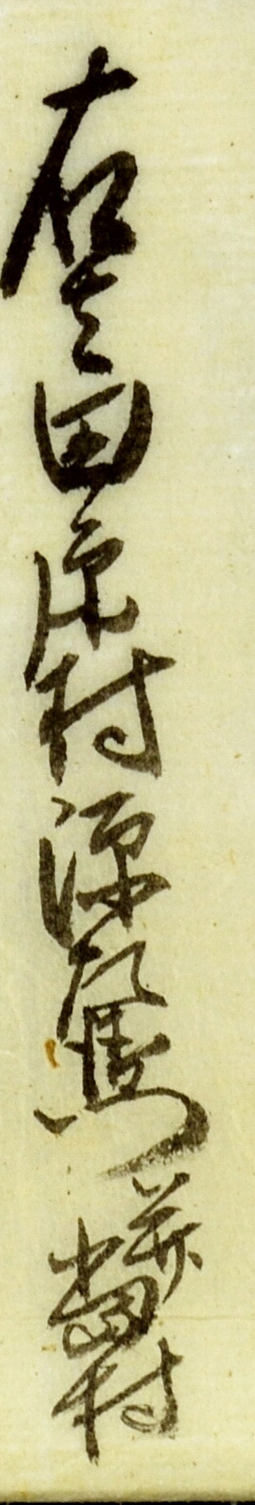右者田原村源左衛門并当村
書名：材木川下ケ分一上納帳
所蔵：伊那市立高遠町図書館・合同会社AMANE
